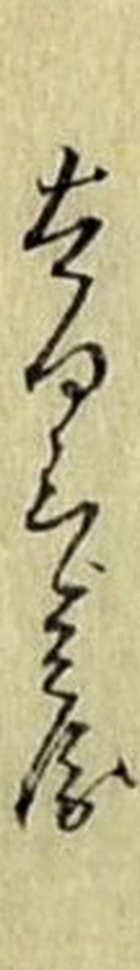太田三郎兵衛
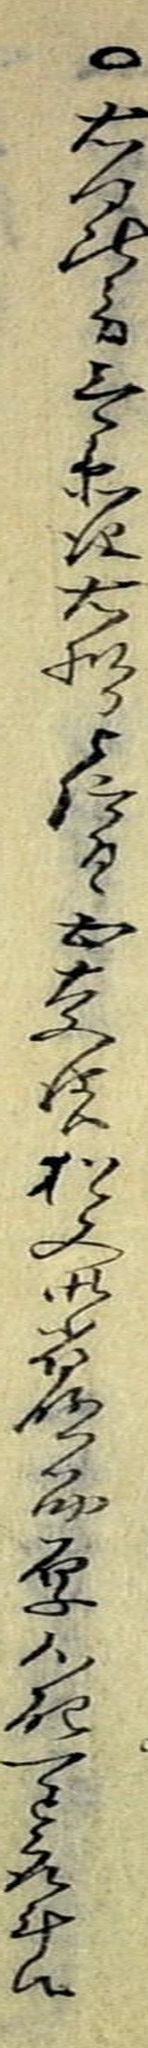○右同断に付三郎兵衛儀右掛り被仰付候五太夫は猶又御省略筋厚心配可被取斗候
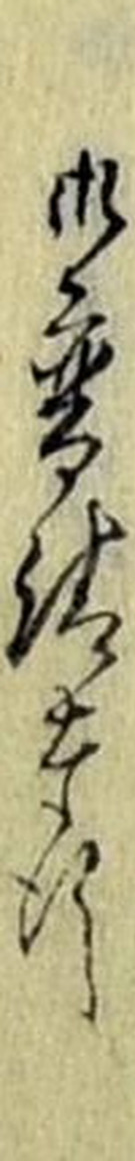御普請奉行
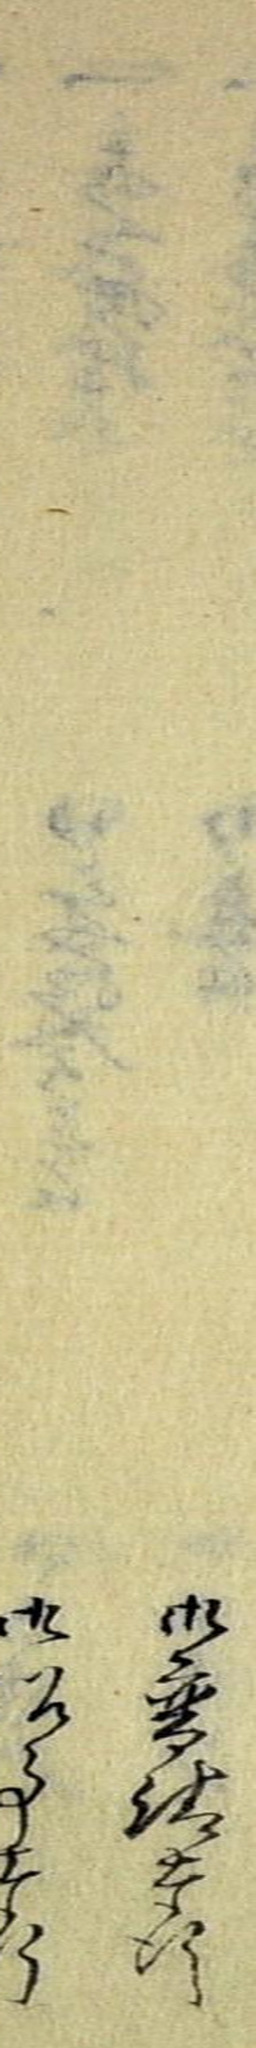御作事奉行
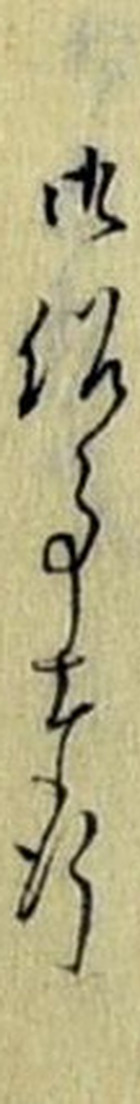御作事奉行
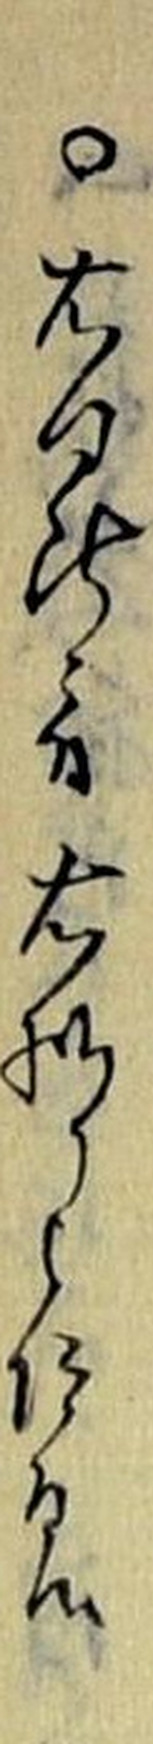○右同断に付右掛り被仰付候
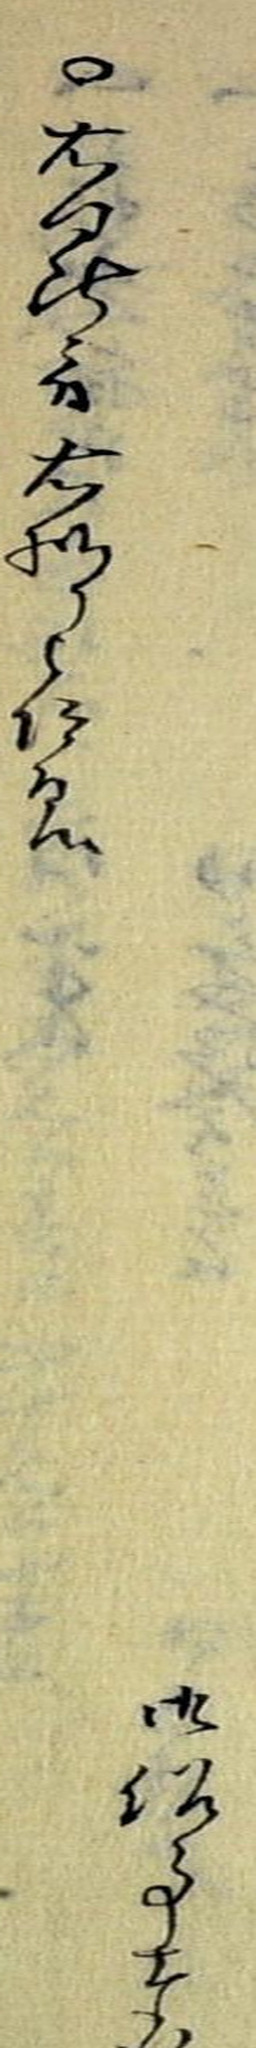○右同断に付右掛り被仰付候
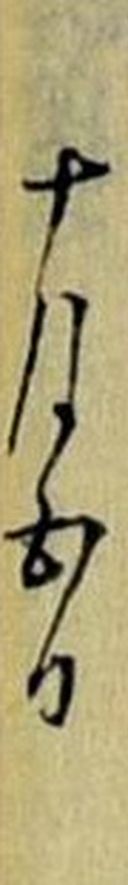十月五日
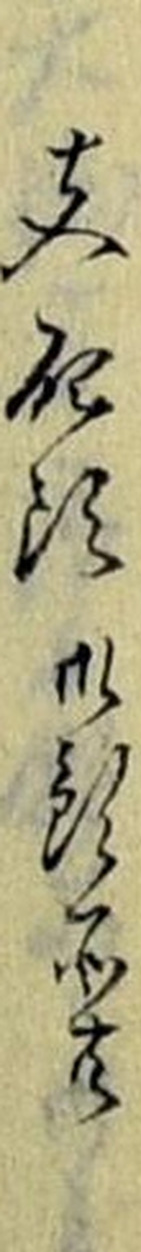支配頭御預所共
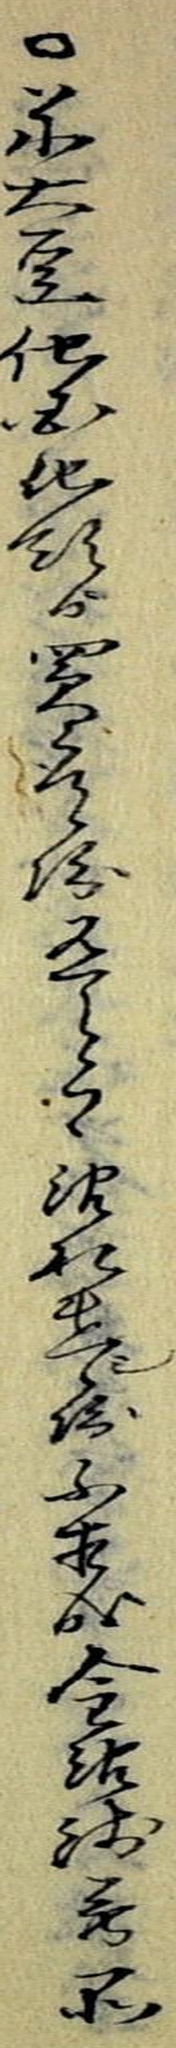○米大豆他国他領ゟ買取候儀有之候はヽ銀札遣し候儀不相成金銀銭并品
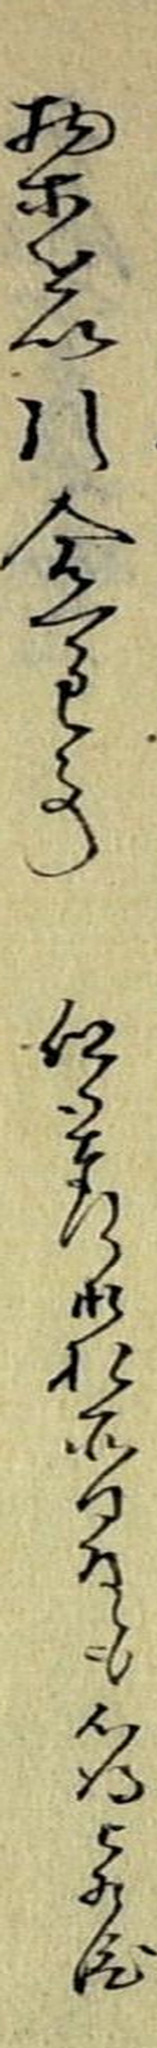物等を以引合可申事但御奉行御札所目付へも心得被相渡
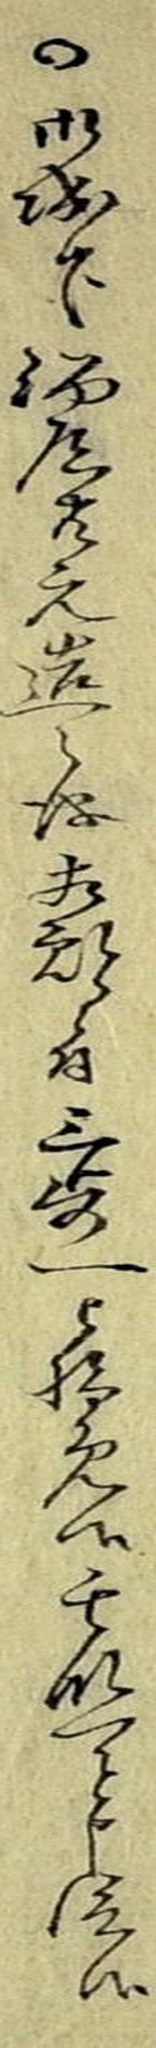○御城下酒造共元造之儀相願候に付三歩一被差免候其段可被申渡候
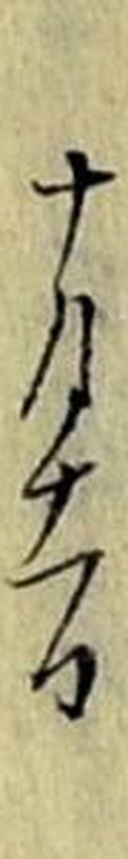十月十一日
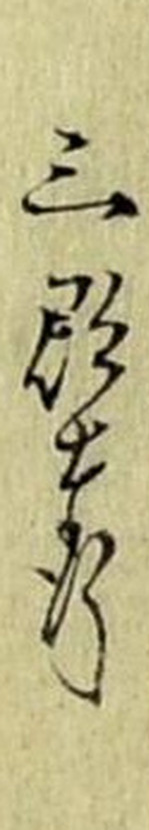三郡奉行
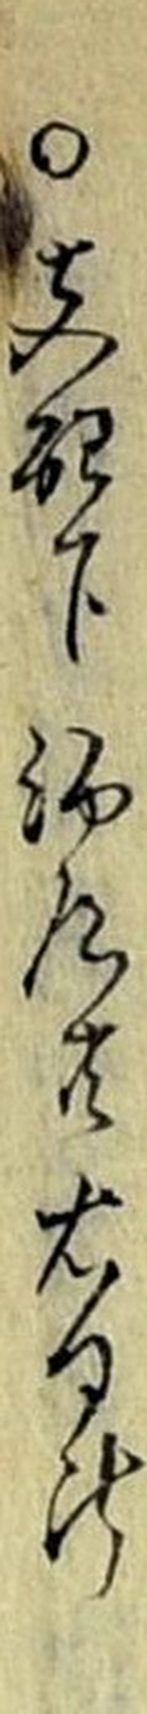○支配下酒屋共右同断
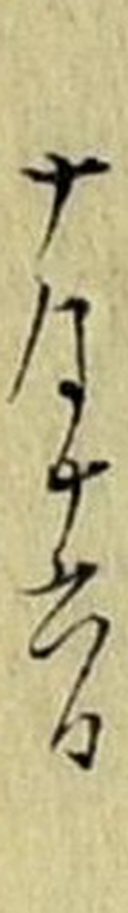十月十六日
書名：命令之部 六
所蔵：福井県文書館 Fukui Prefectural Archives
